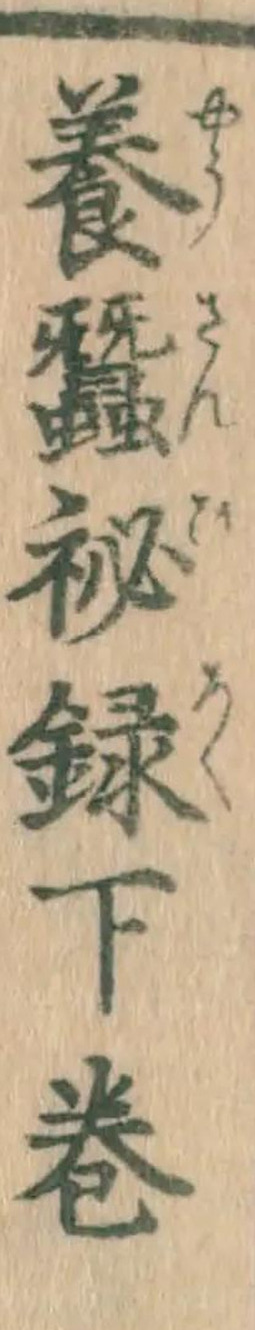養蚕秘録下巻
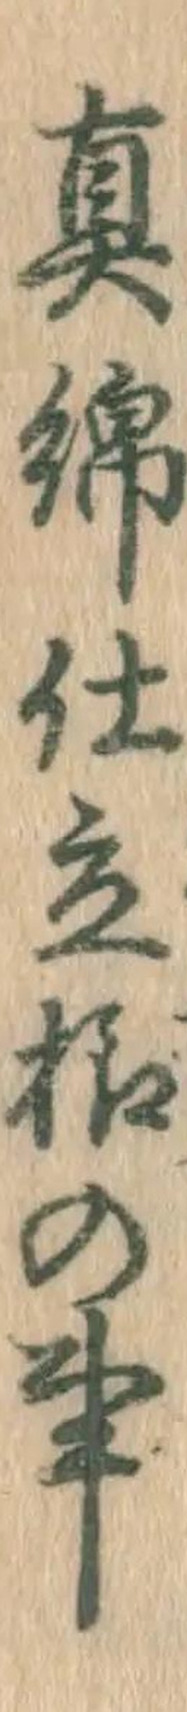真綿仕立様の事
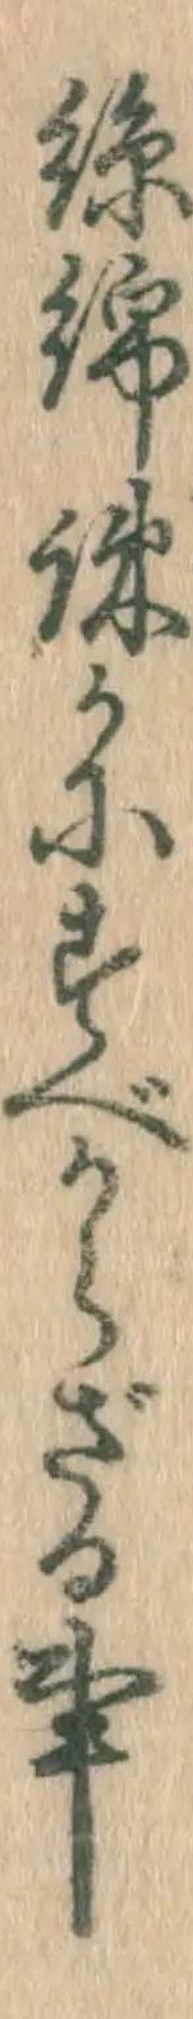糸綿疎かにすべからざる事
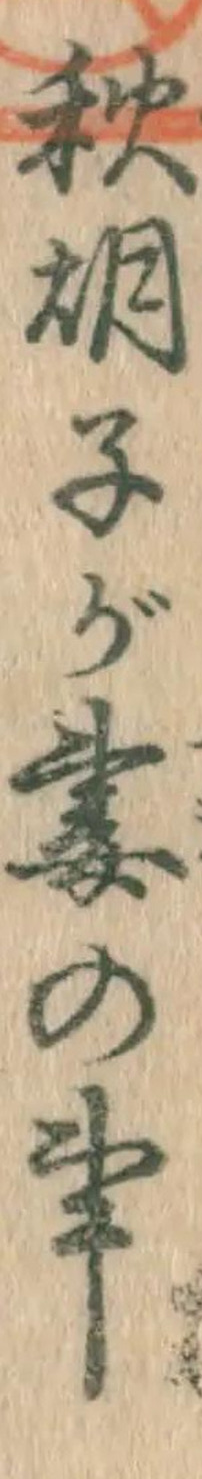秋胡子が妻の事
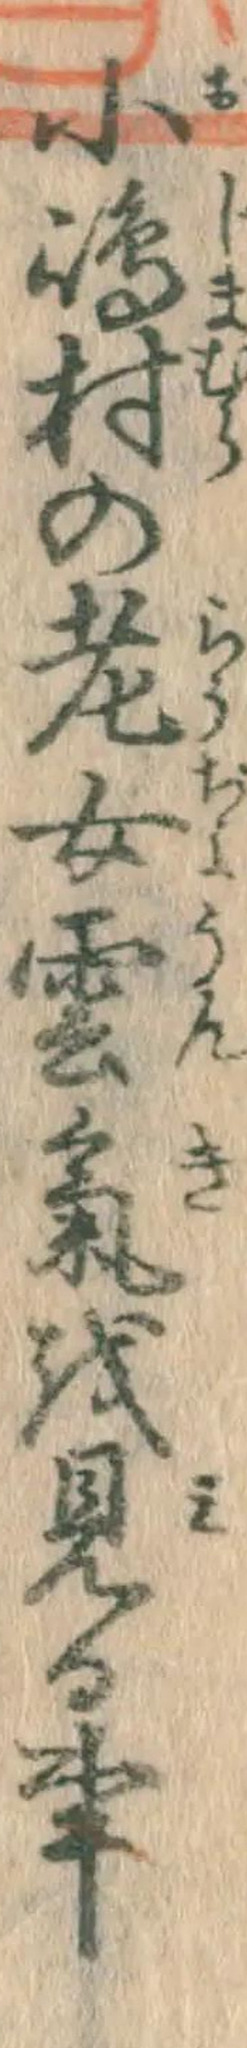小嶋村の老女雲気を見る事
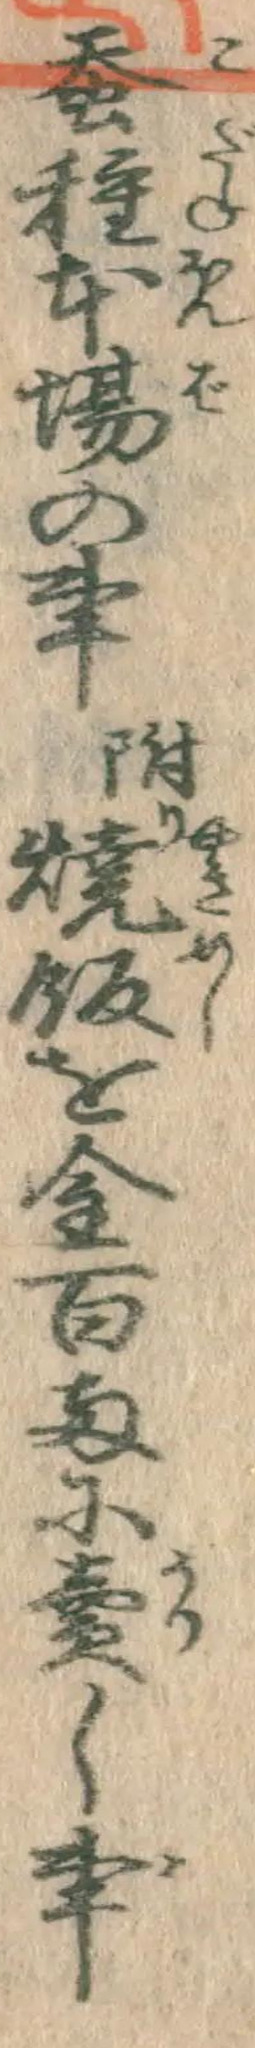蚕種本場の事附り焼飯を金百両に売し事
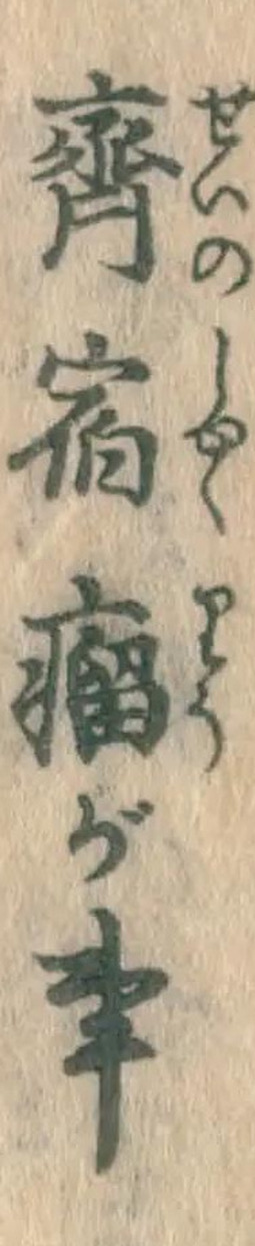斉宿瘤が事

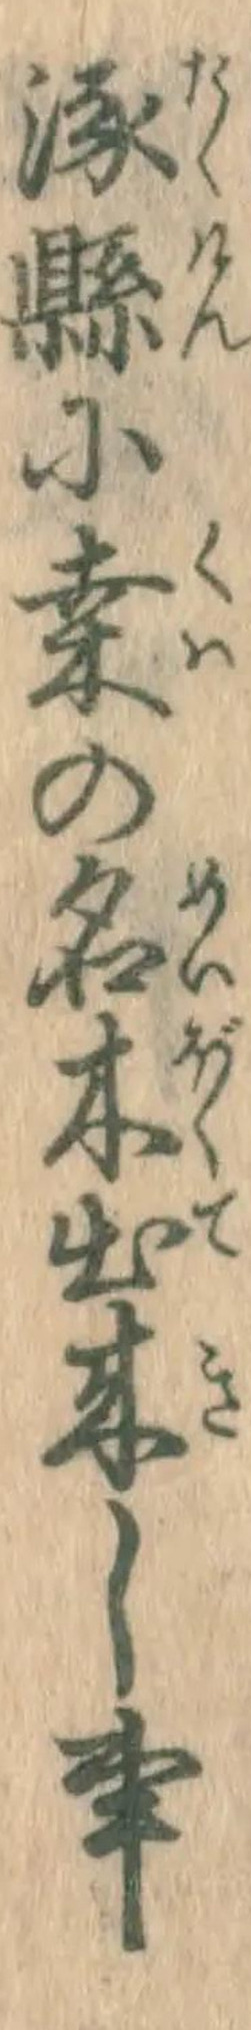涿県に桑の名木出来し事
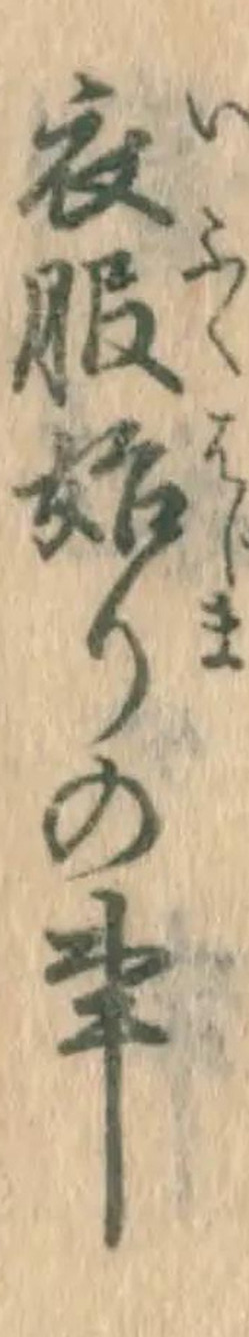衣服始りの事
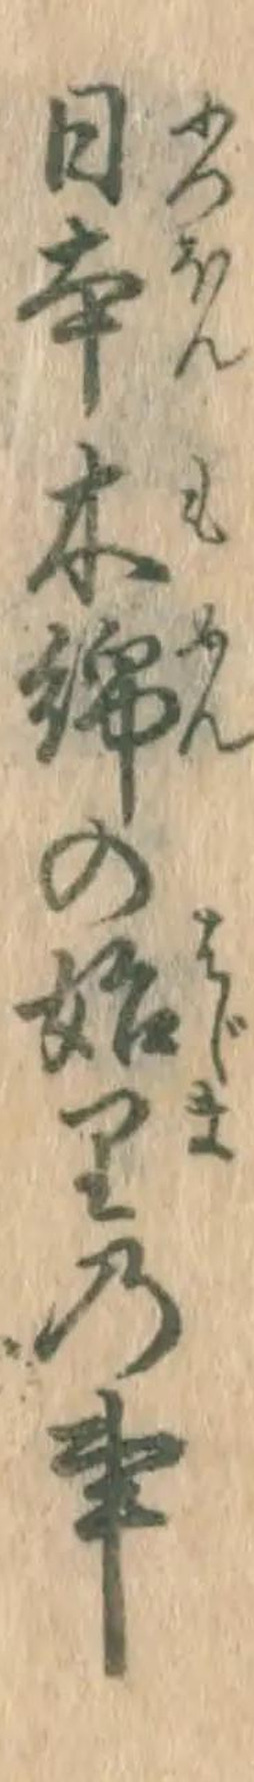日本木綿の始りの事
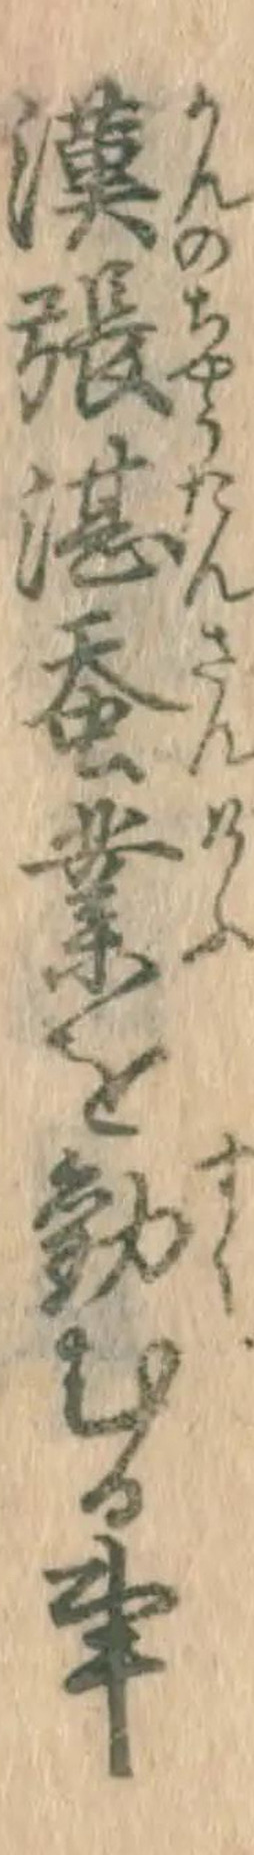漢張湛蚕業を勧むる事
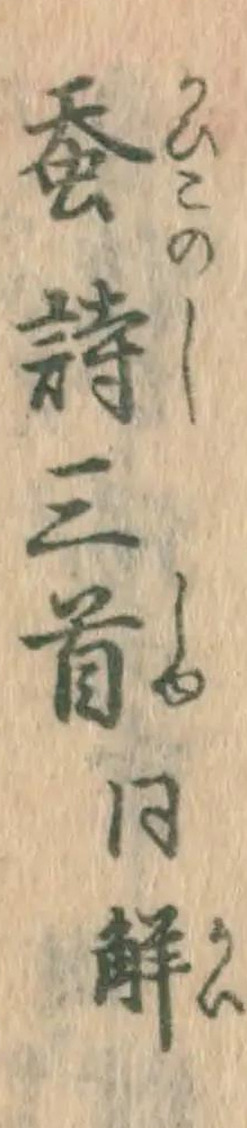蚕詩三首同解
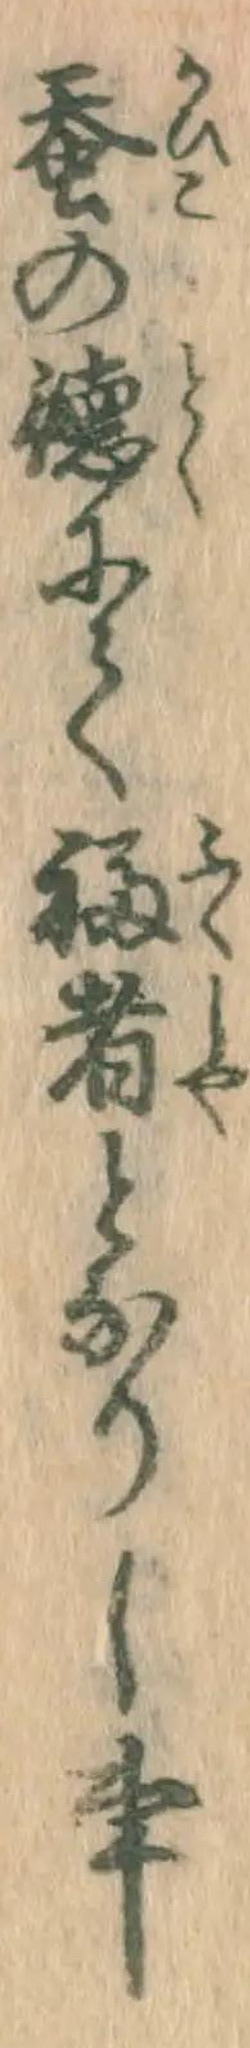蚕の徳にて福者となりし事
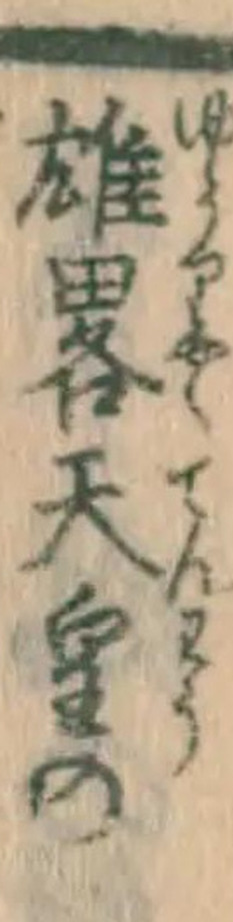雄略天皇の
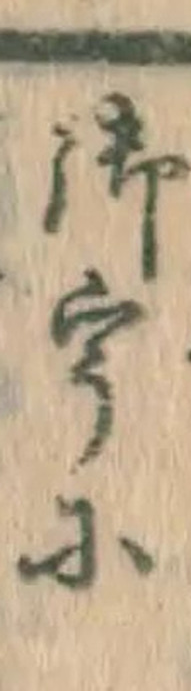御宇に
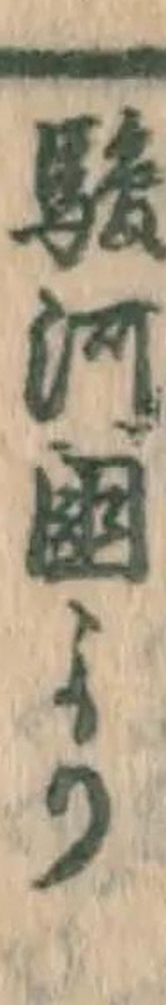駿河国より
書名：養蚕秘録 3巻. [3]
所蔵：国立国会図書館 National Diet Library, JAPAN
